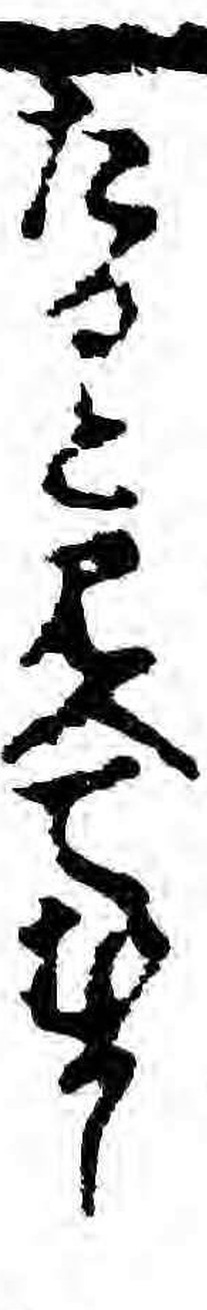たると見へてむかし
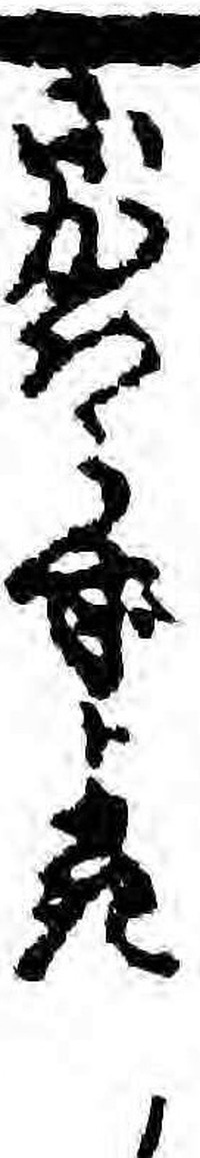にかはらずよき
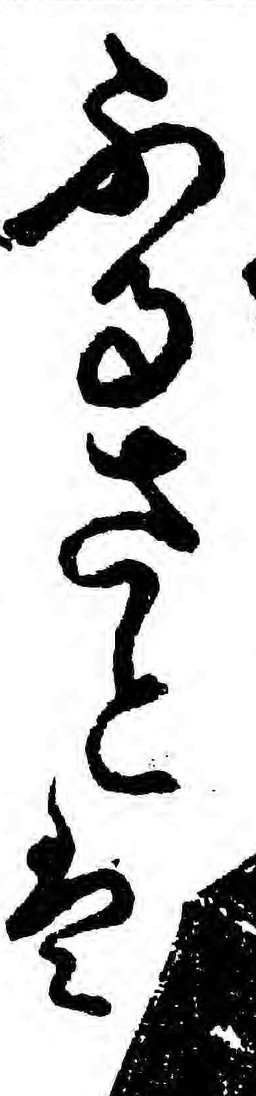ふるさとは
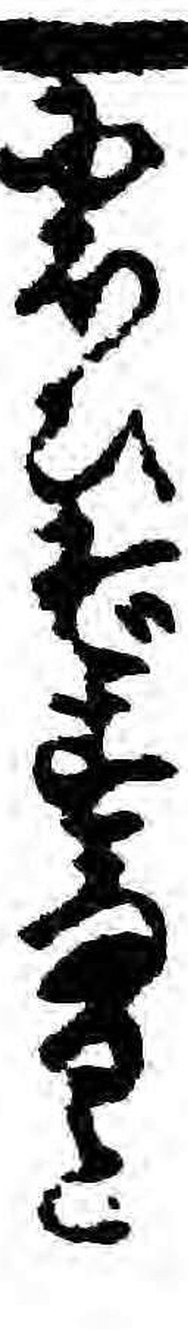にほいぞすなると
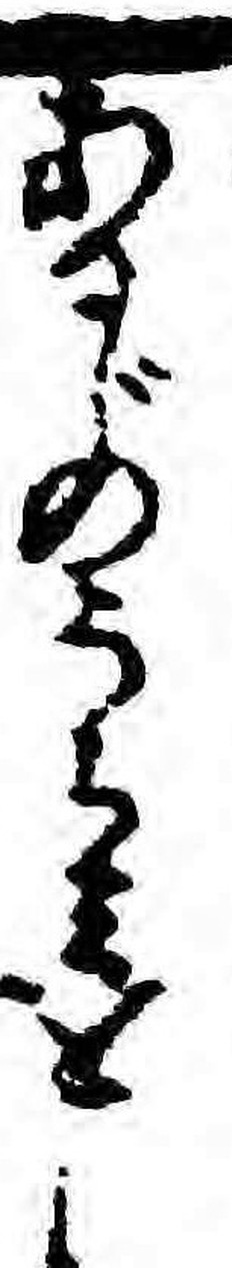あるじのうらみを
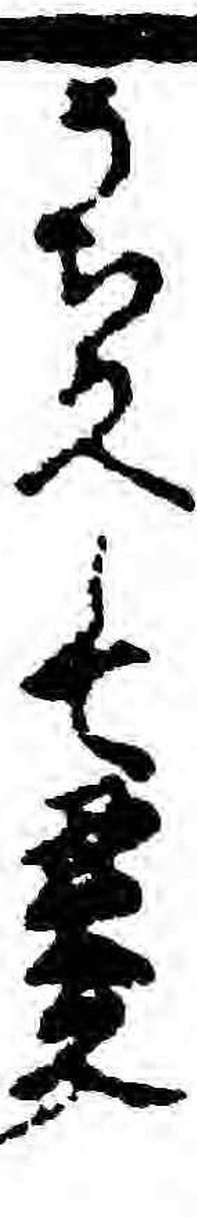うちかへして貫之
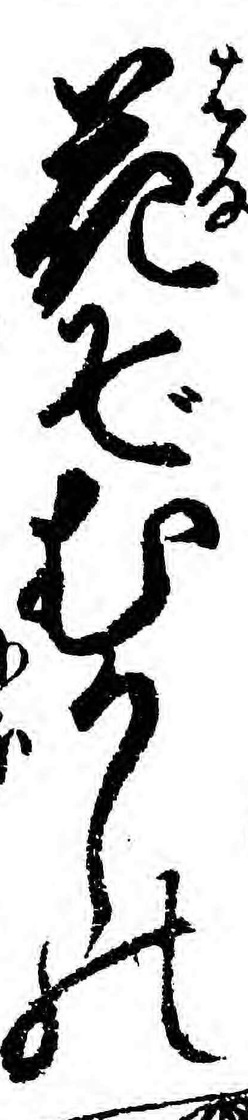花ぞむかしの
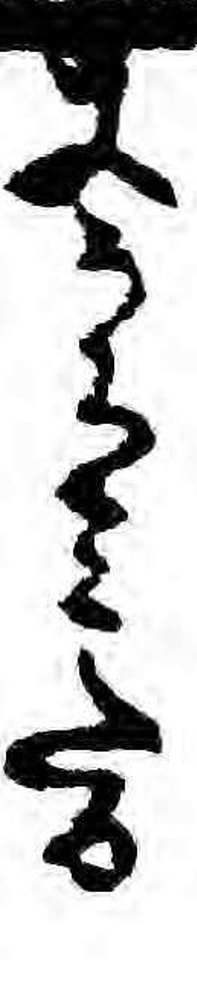又うらみたる
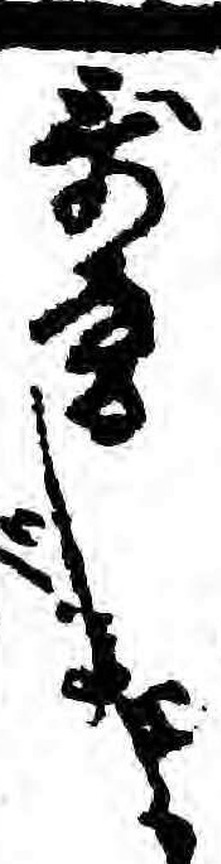哥なる
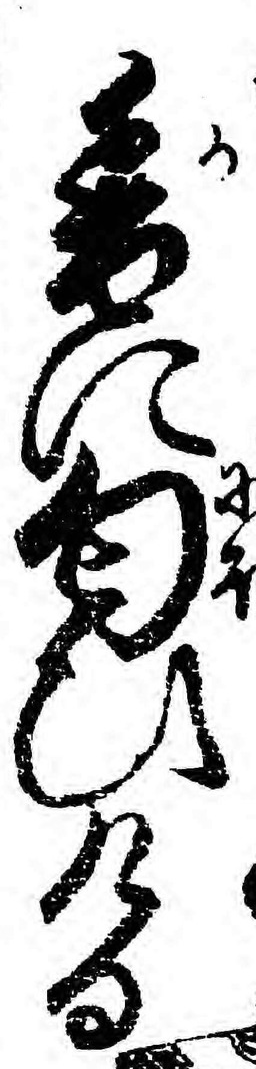香に匂ひける

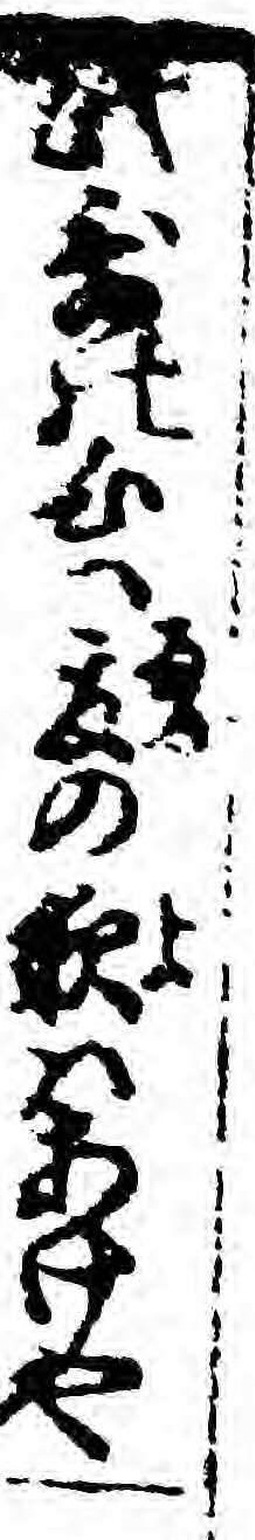此哥の心は夏の夜はあけや
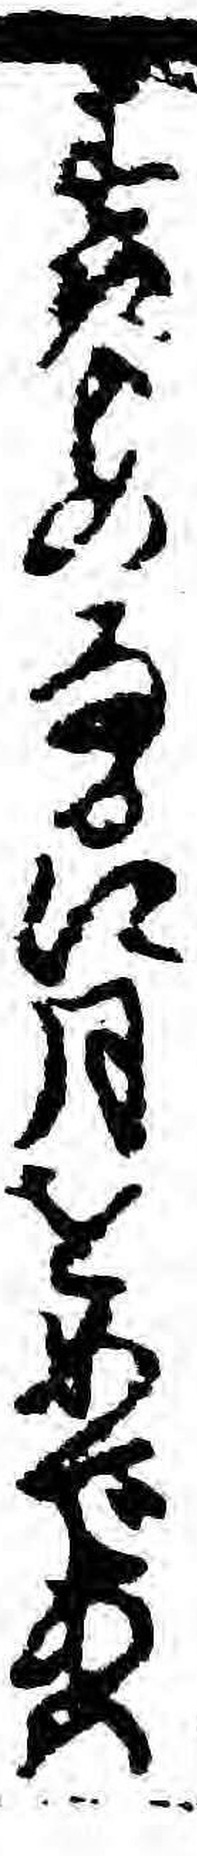すきものなるに月をめであは
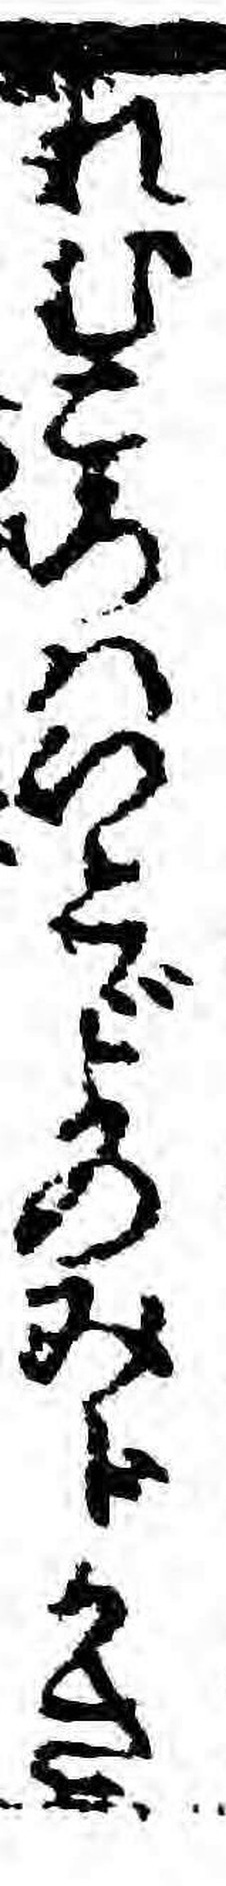れむころはいとゞよのみじかさ
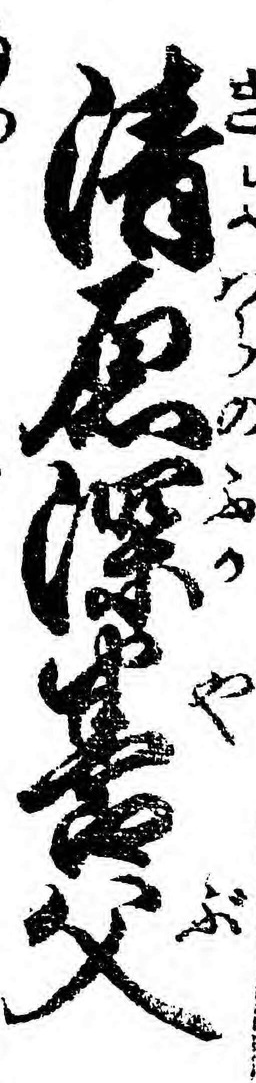清原深養父
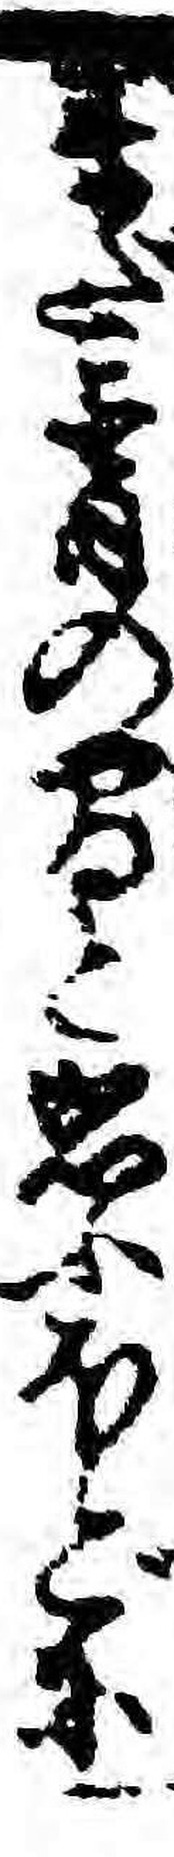まで宵の間と思ふほどに
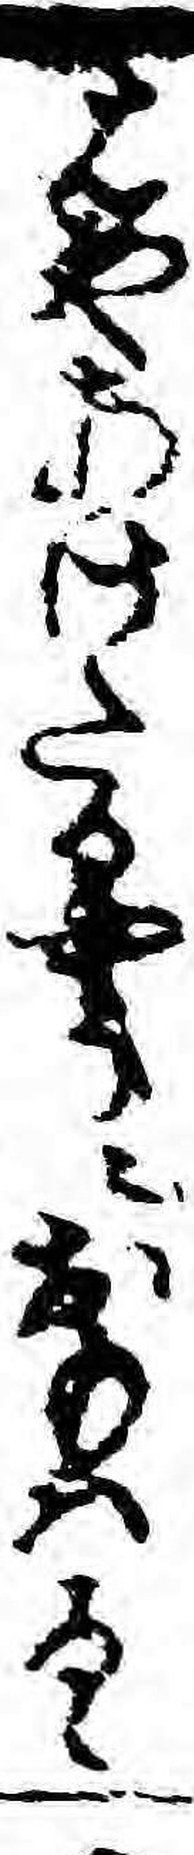はやあけたるやうにおもはるゝ
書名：頭書和歌注譯／壽賀多百人一首小倉錦
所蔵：国文学研究資料館
